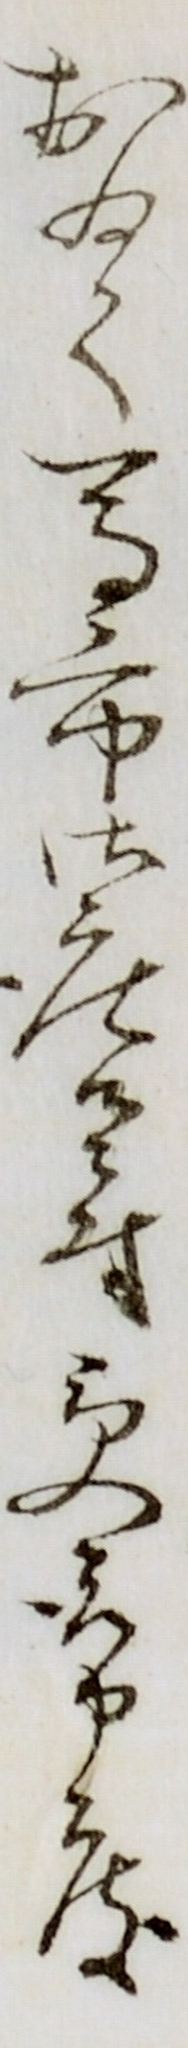おゐて馬市御座候に付受取申度
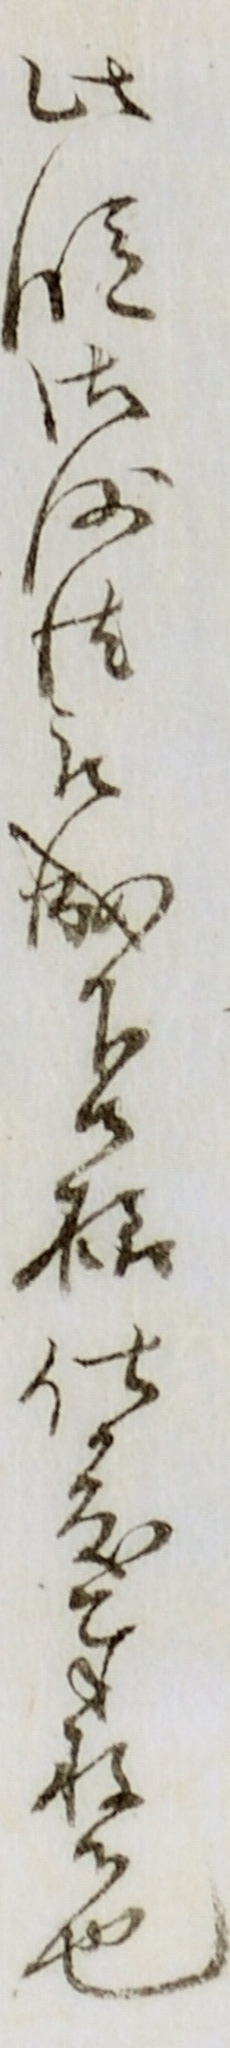此段御沙汰被成下候様仕度奉存候也
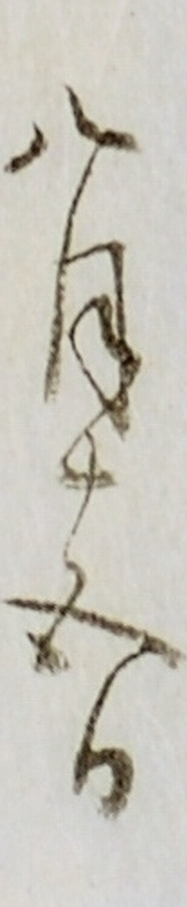八月十五日
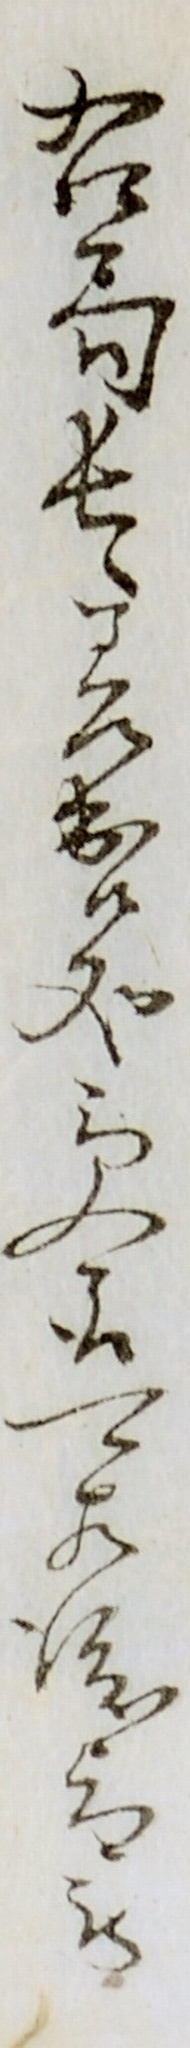右局長へ差出候処受取可相渡旨被
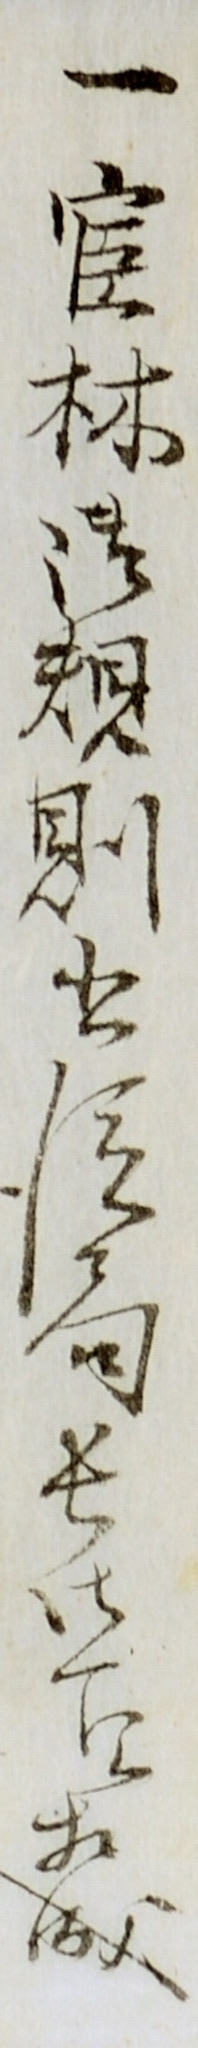一官林御規則書従局長御下ケ相成
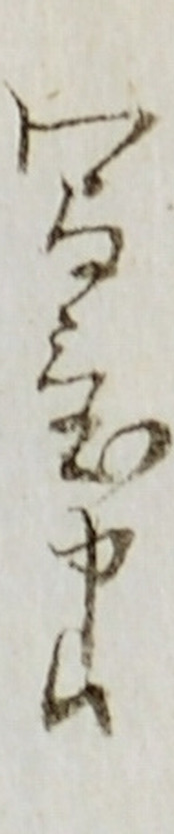写置申候
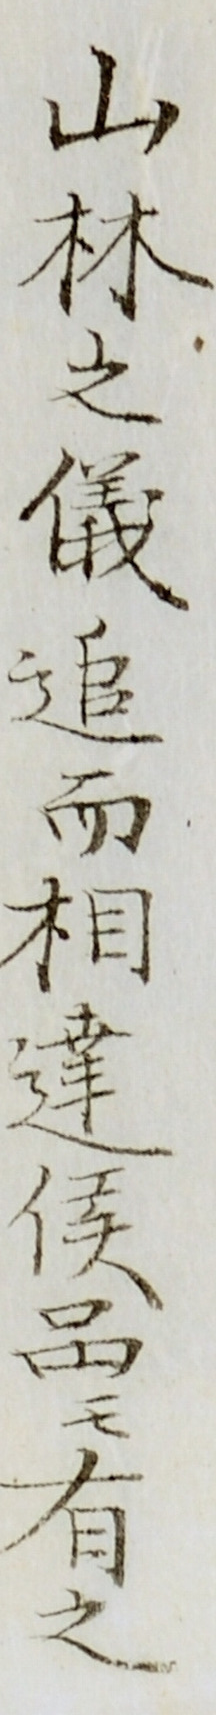山林之儀追て相達候品も有之
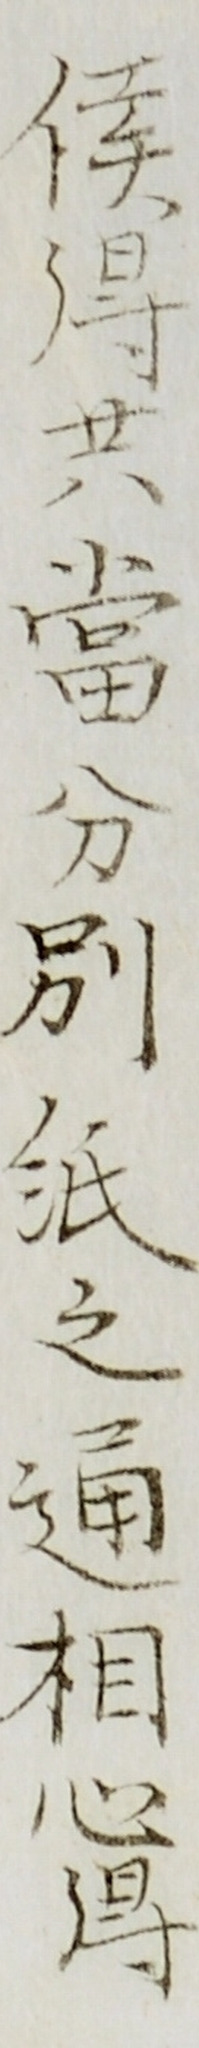候得共当分別紙之通相心得
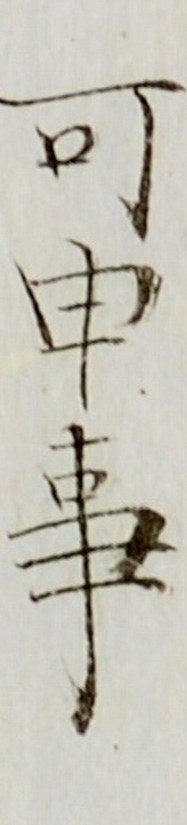可申事
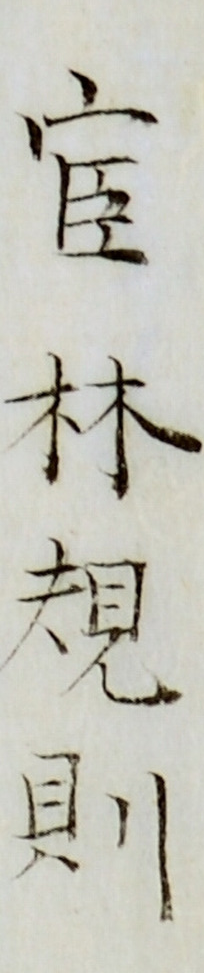官林規則
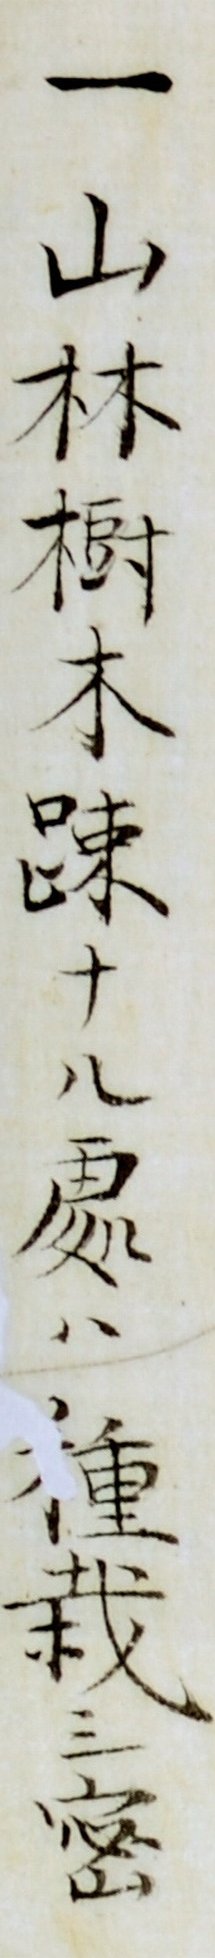一山林樹木疎ナル処ハ種栽シ密

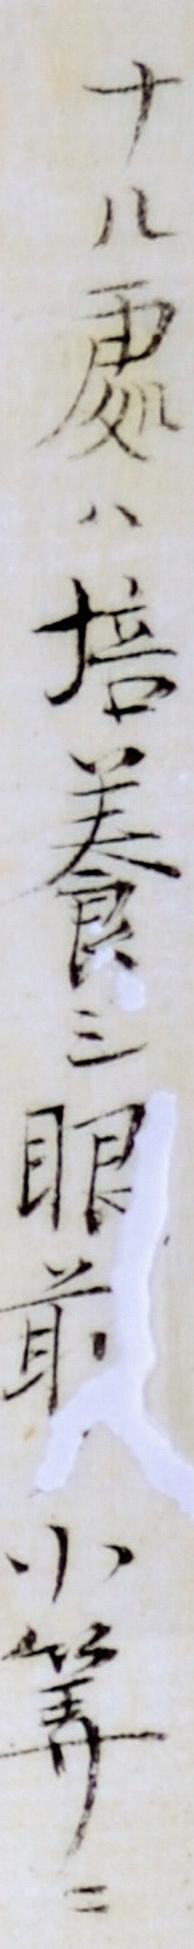ナル処ハ培養シ眼前小算ニ
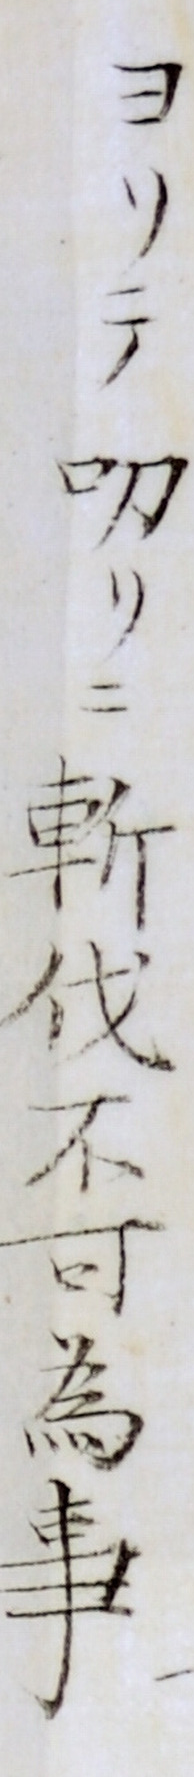ヨリテ切リニ斬伐不可為事
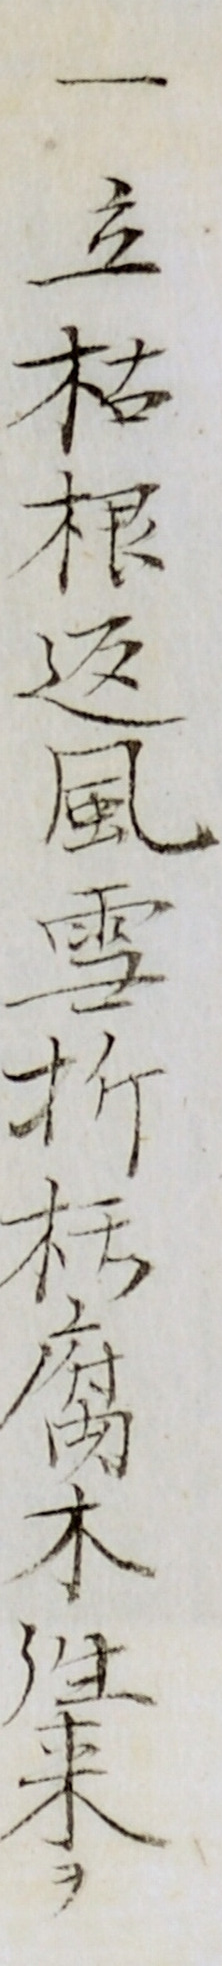一立枯根返風雪折朽腐木往来ヲ
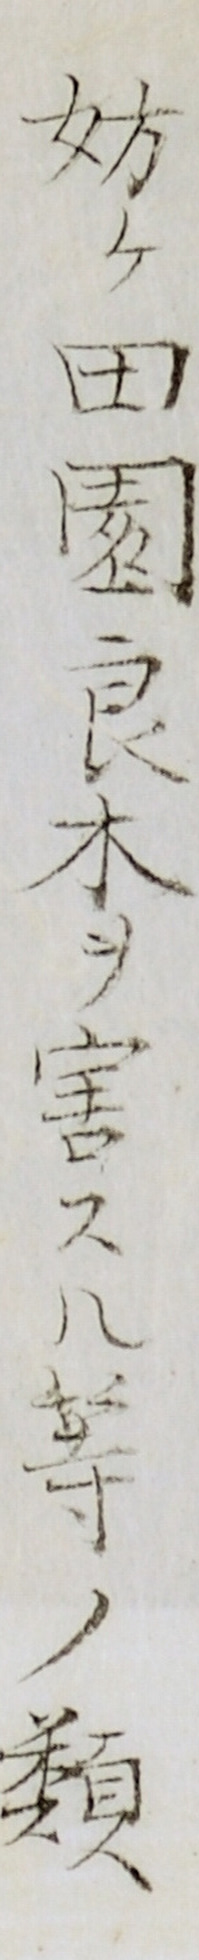妨ケ田園良木ヲ害スル等ノ類
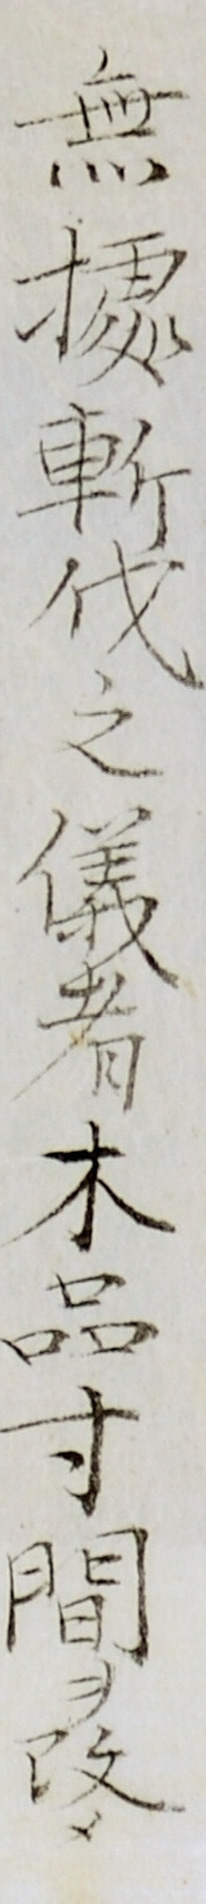無拠斬伐之儀者木品寸間ヲ改メ
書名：山林方諸事御用留
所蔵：伊那市立高遠町図書館・合同会社AMANE
